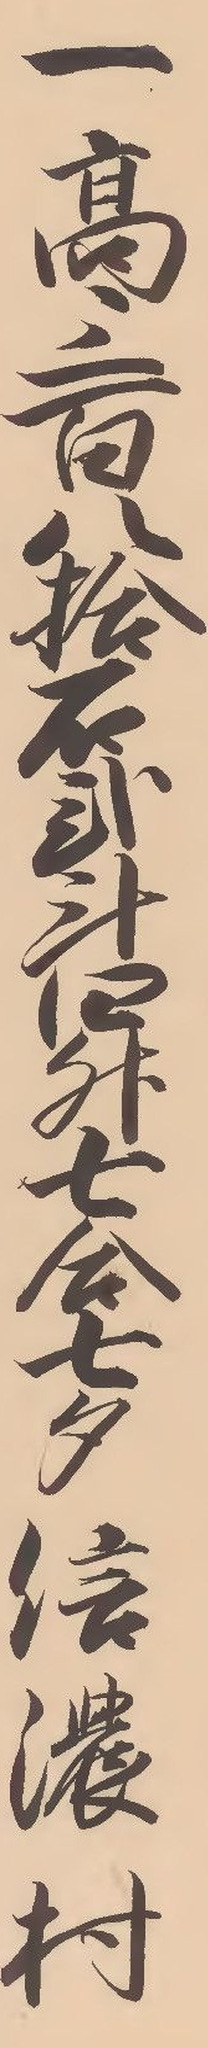一高三百八拾石弐斗四升七合七勺信濃村
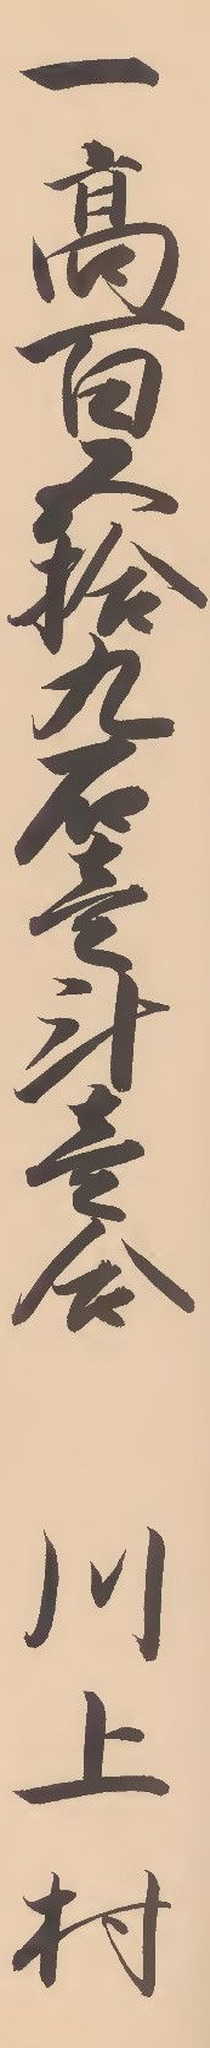一高百五拾九石壱斗壱合川上村
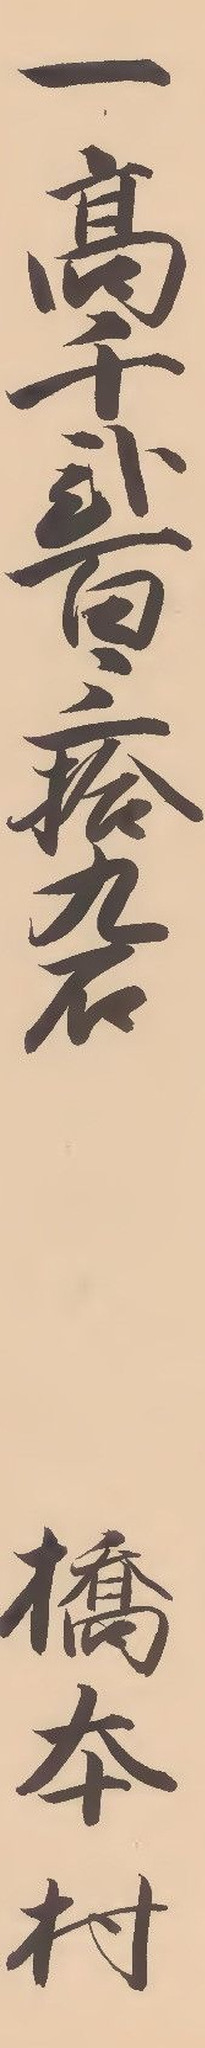一高千弐百三拾九石橋本村
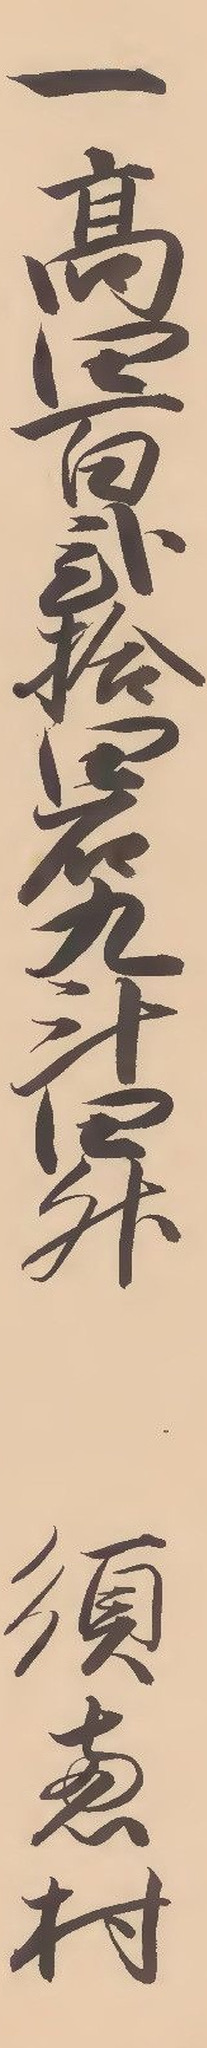一高四百弐拾四石九斗四升須恵村
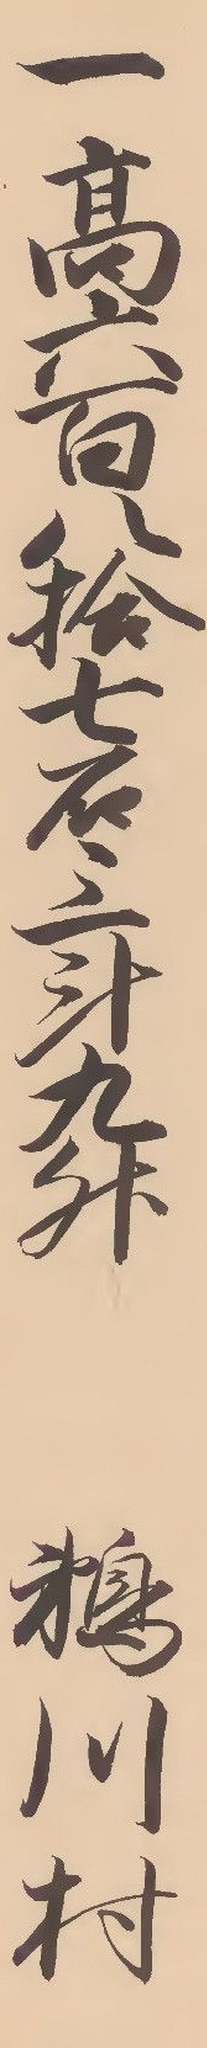一高六百八拾七石三斗九升鵜川村

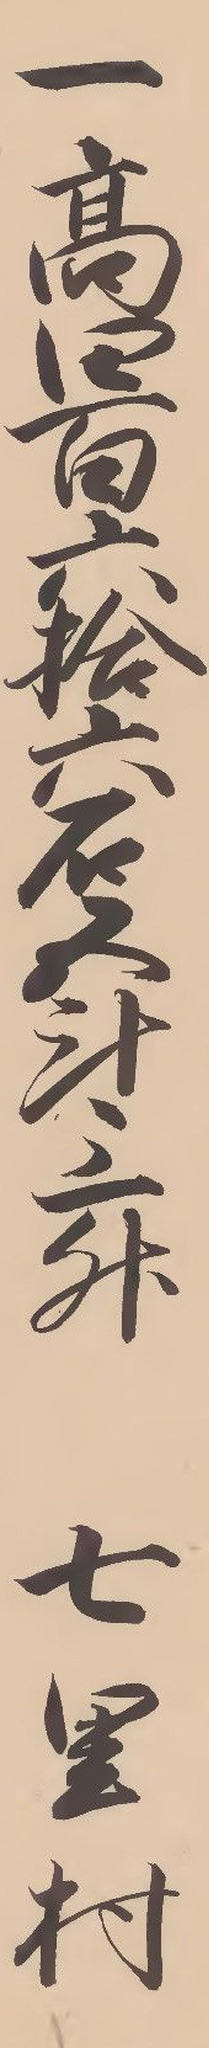一高四百六拾六石五斗三升七里村
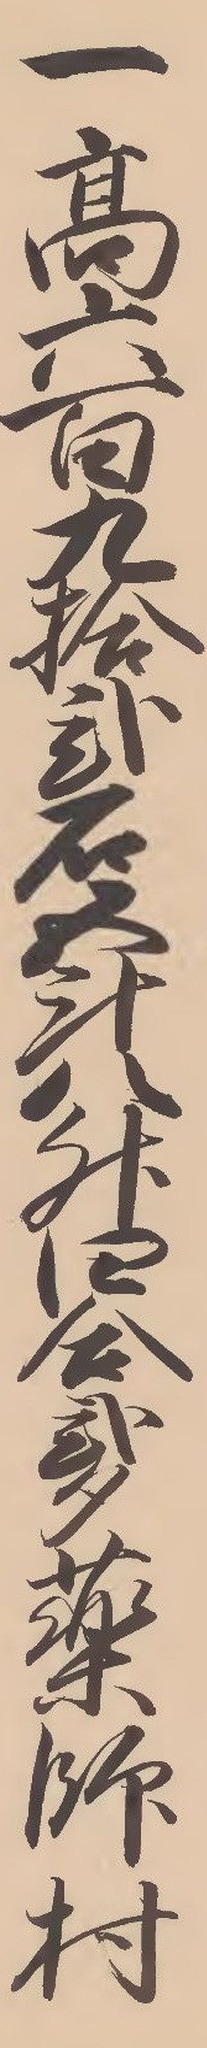一高六百九拾弐石五斗八升四合弐勺薬師村
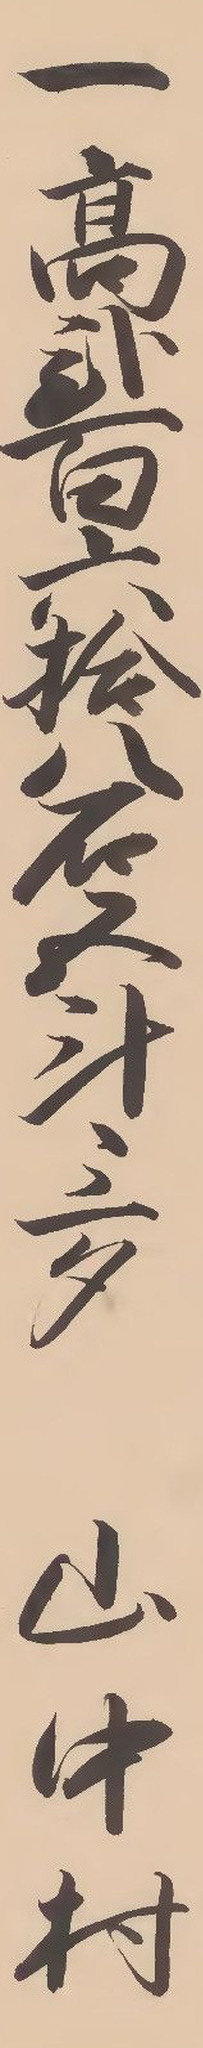一高弐百六拾八石五斗三勺山中村
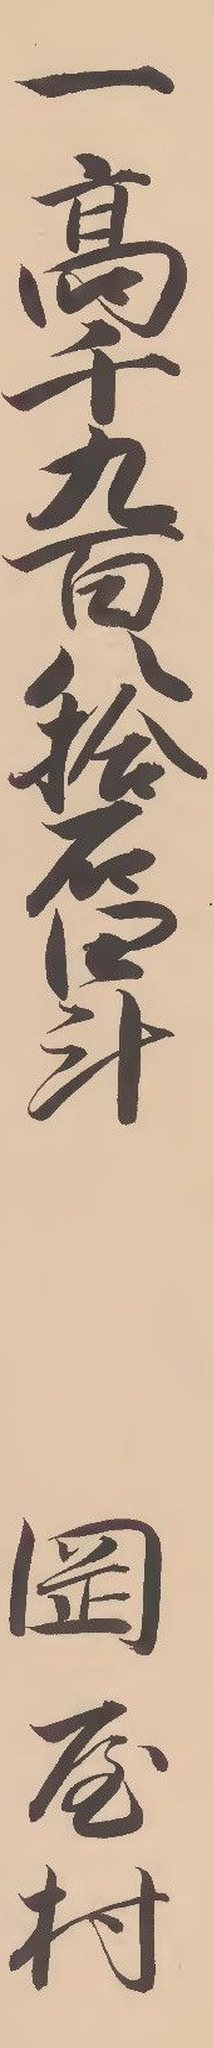一高千九百八拾石四斗岡屋村
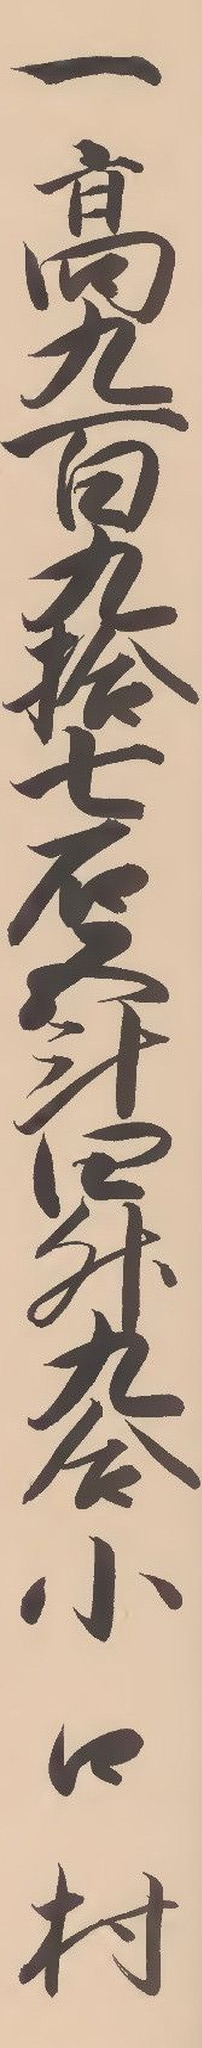一高九百九拾七石五斗四升九合小口村
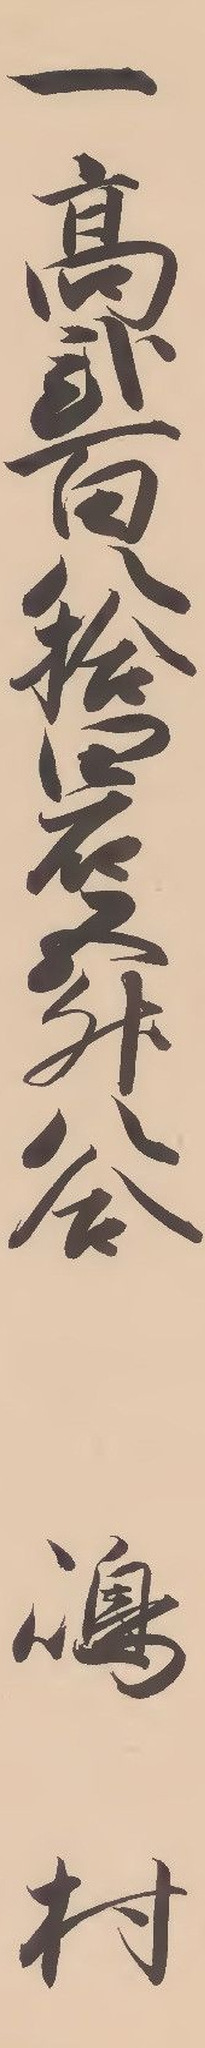一高弐百八拾四石五升八合島村
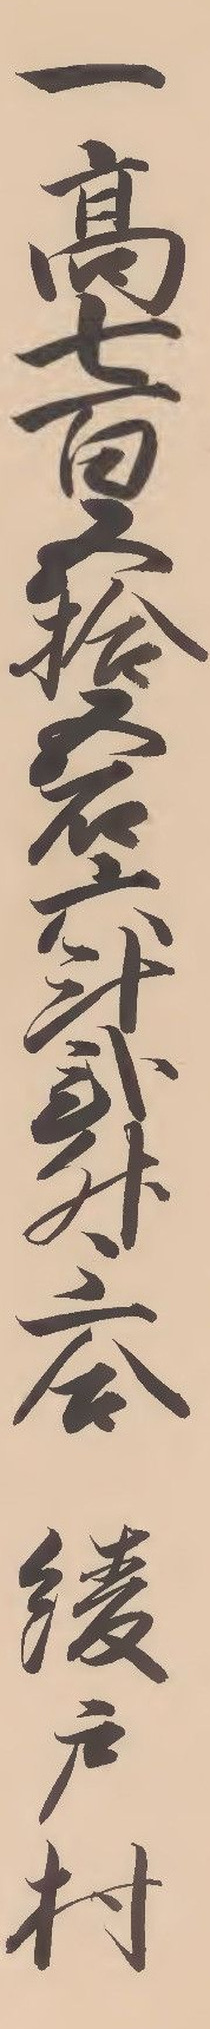一高七百五拾五石六斗弐升三合綾戸村
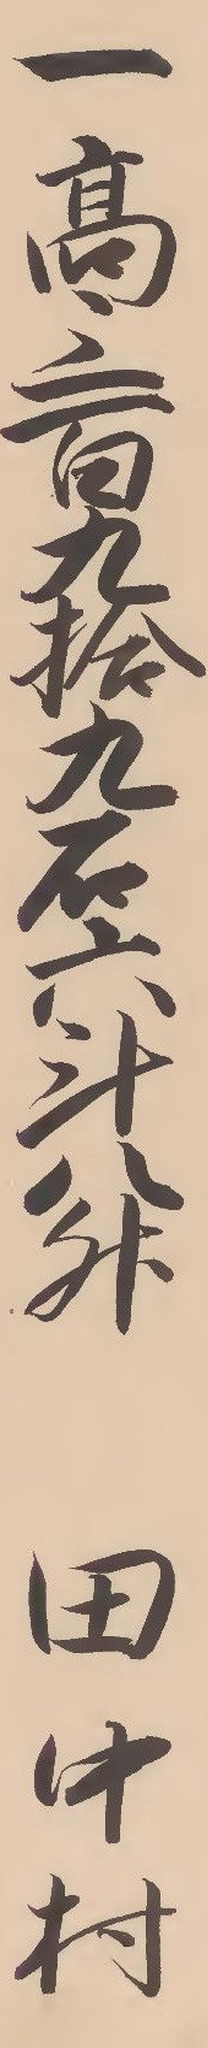一高三百九拾九石六斗八升田中村

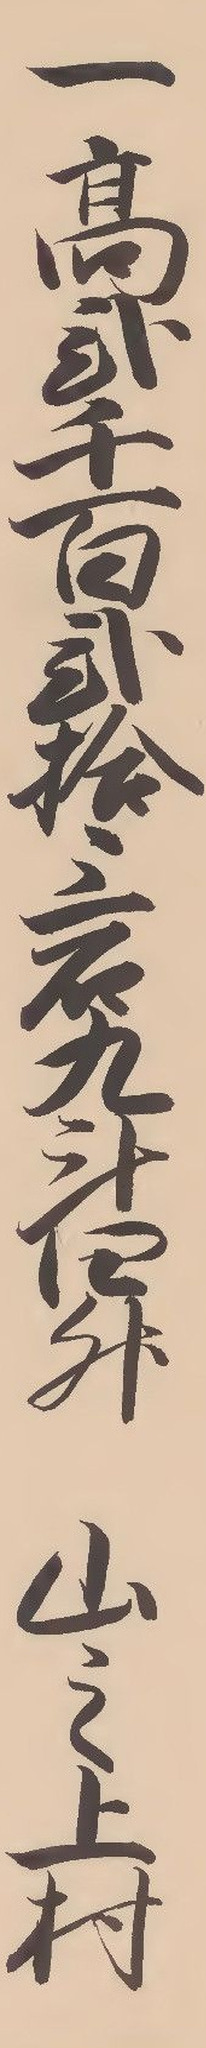一高弐千百弐拾三石九斗四升山之上村
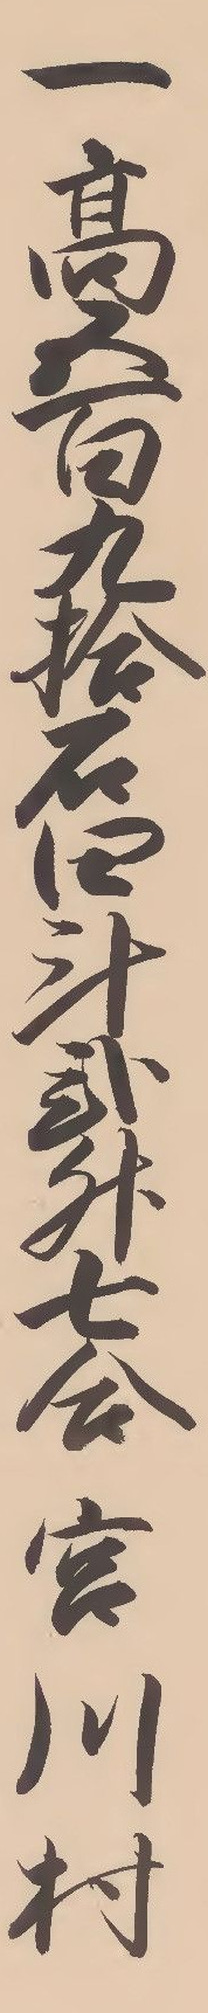一高五百九拾石四斗弐升七合宮川村
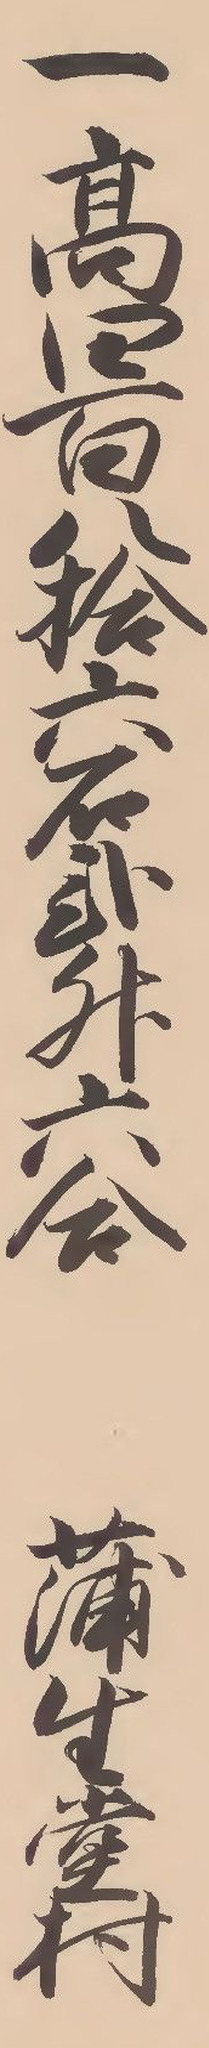一高四百八拾六石弐升六合蒲生堂村
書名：近江国郷帳
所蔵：国立公文書館 National Archives of Japan
